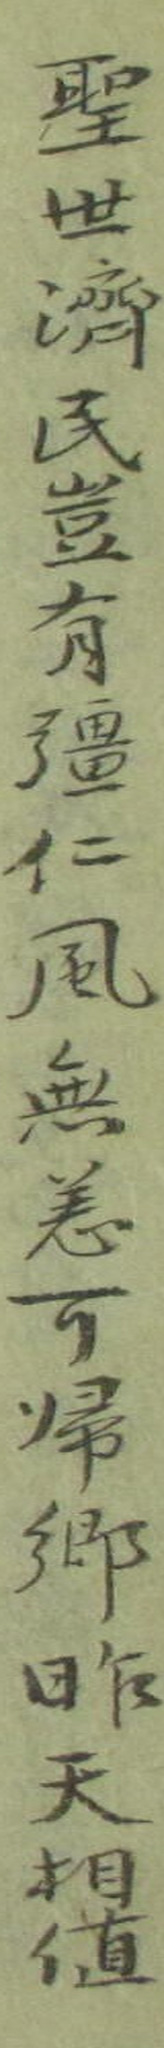聖世済民豈有彊仁風無恙可帰郷昨天相値
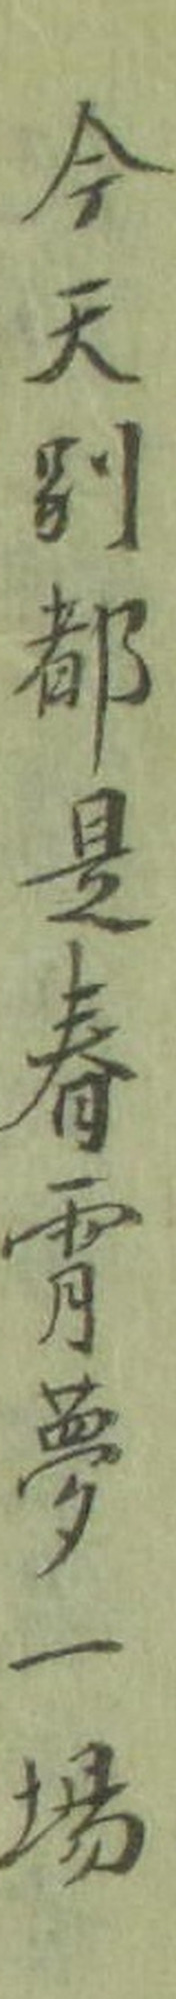今天別都是春宵夢一場
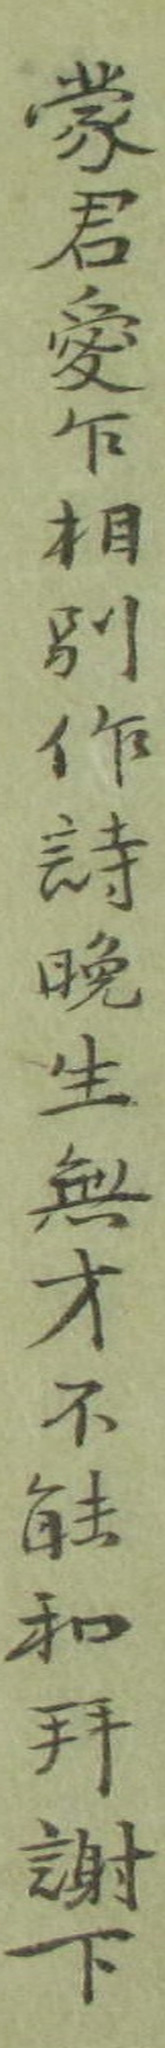蒙君愛乍相別作詩晩生無才不能和拝謝下
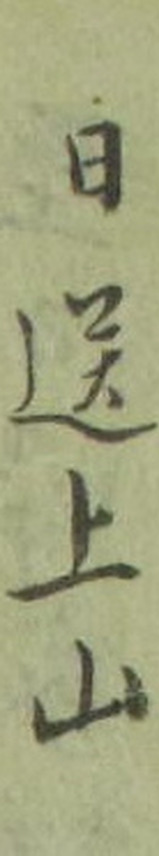日送上山
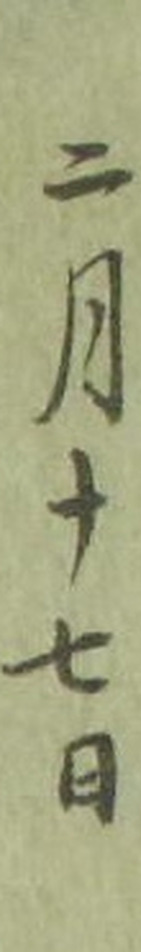二月十七日
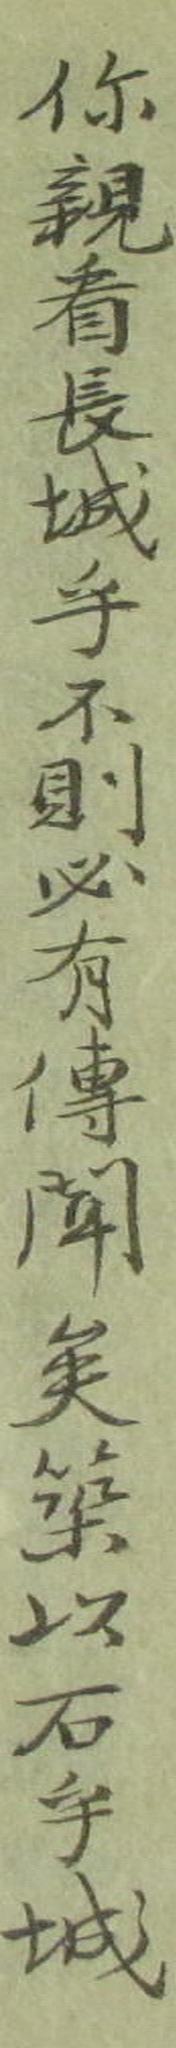你親看長城乎不則必有伝聞矣築以石乎城
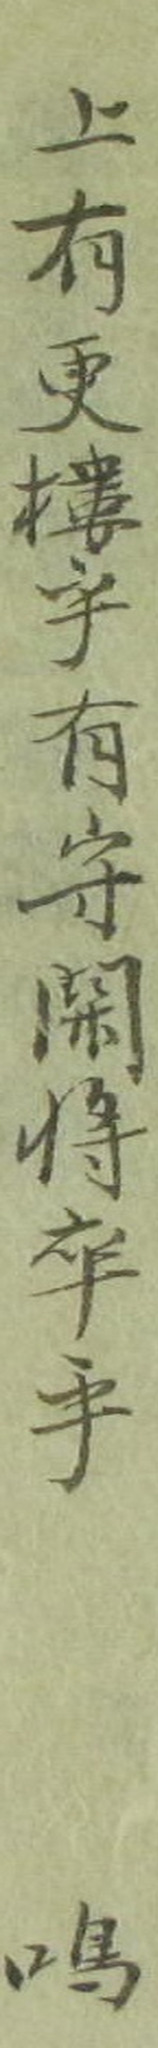上有更楼乎有守関将卒乎鳴
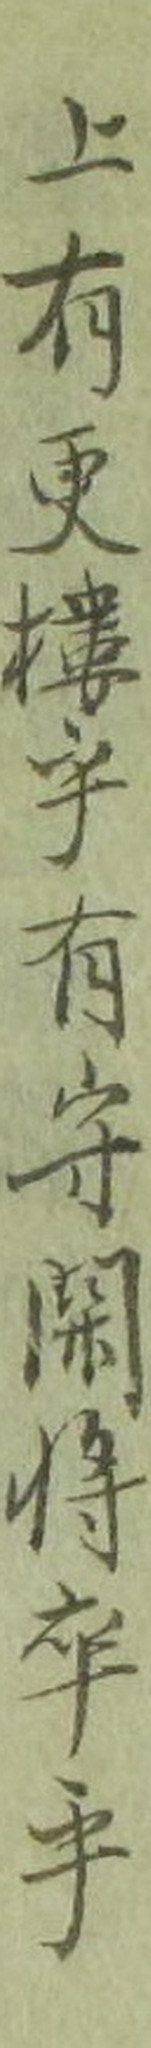上有更楼乎有守関将卒乎鳴
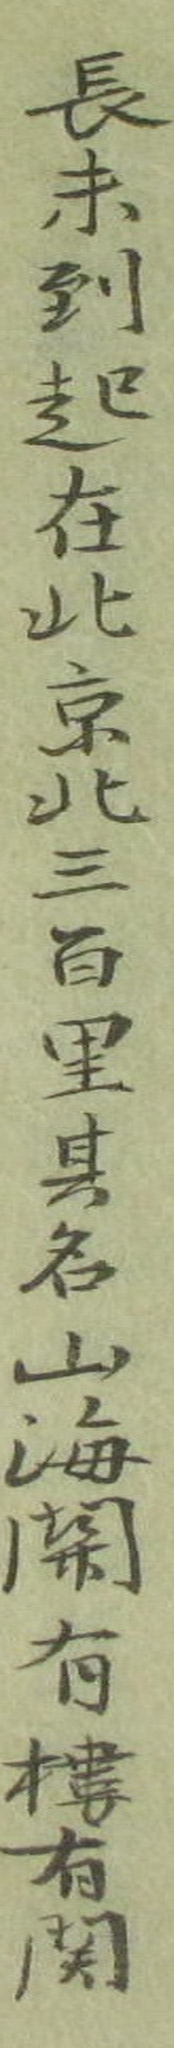長未到起在北京北三百里其名山海関有楼有関
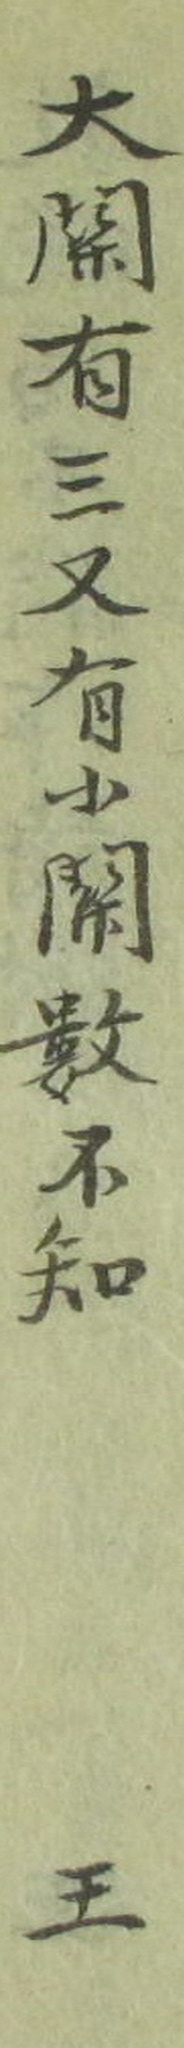大関有三又有小関数不知王
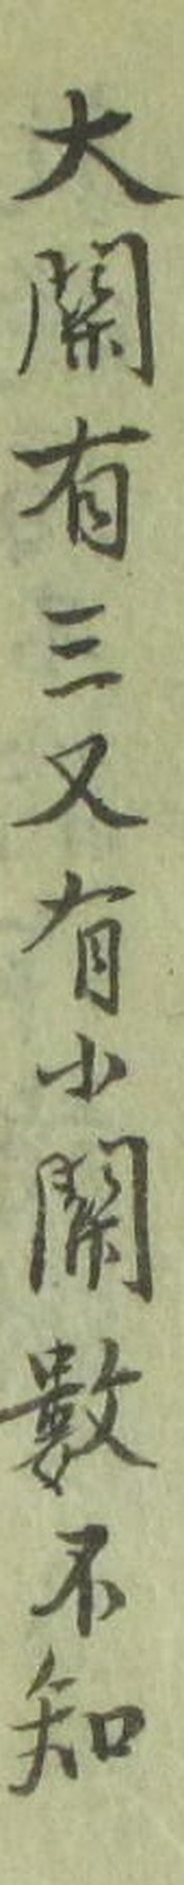大関有三又有小関数不知王
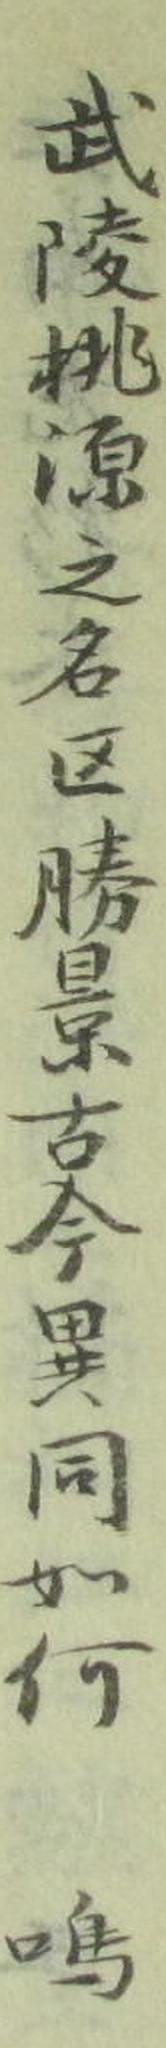武陵桃源之名区勝景古今異同如何鳴
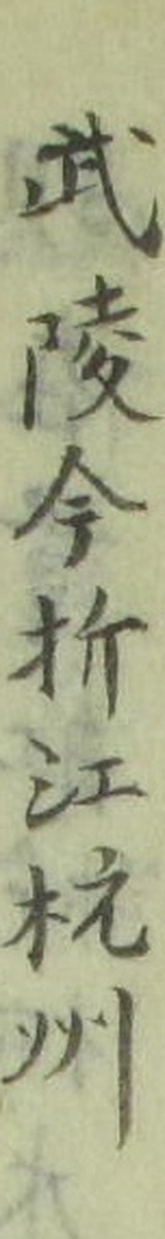武陵今折江杭州王
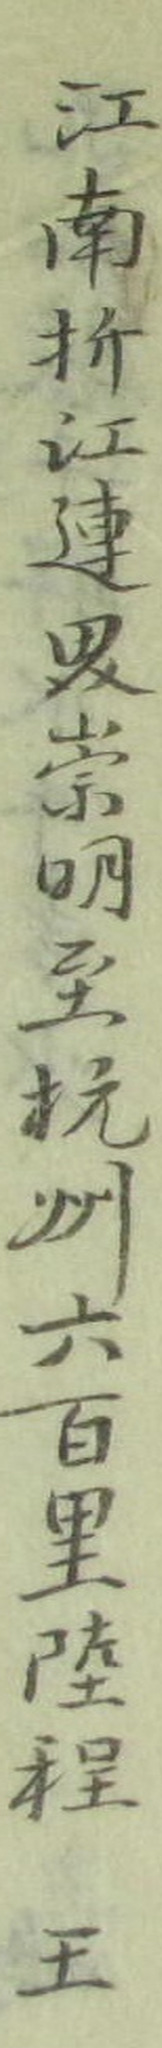江南折江連界崇明至杭州六百里陸程王
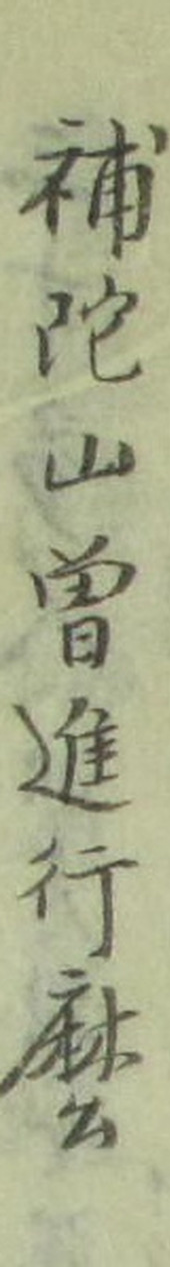補陀山曽進行麼鳴
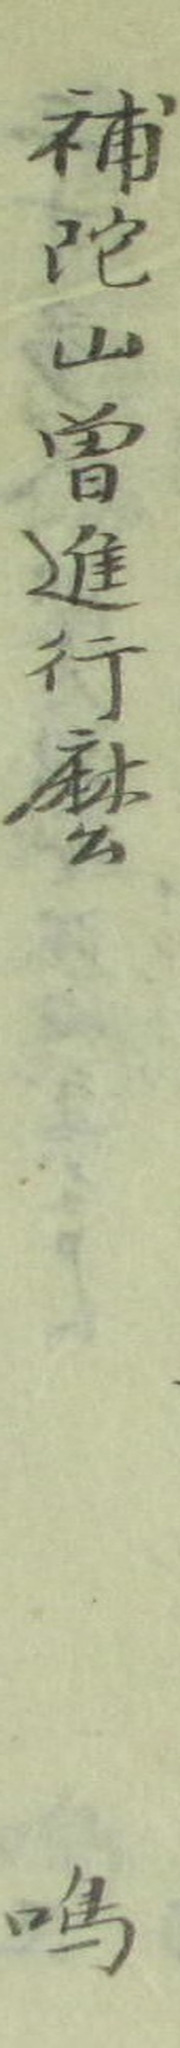補陀山曽進行麼鳴
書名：紀州九木浦庄屋記録 四
